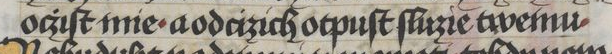ocżiſt mie.a od cizích otpuſt ſluzie twemu.
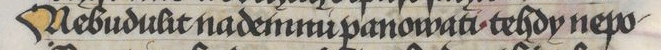Nebudulit nademnú panowati.tehdy nepo¬
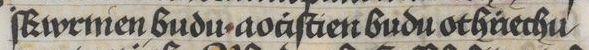ẛkwrnien budu.a oċiſtien budu othṙiechu
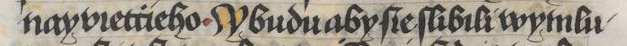nayvietċíeho.Y budu aby ſie ſlibili wymlu¬
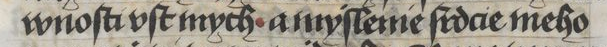wnoſti uſt mych.a myẛlenie ſrdcie meho
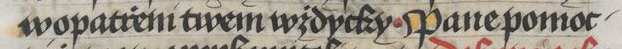w opatṙení twem wżdycky.Pane pomoc¬
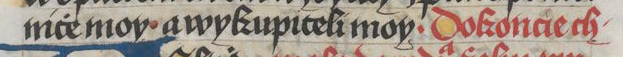níċe moy.a wykupiteli moy.Dokoncie ch¬
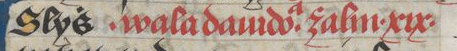Slyṡ.wala davidoa.żalm.xix.
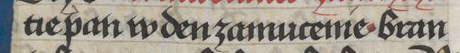tie pan w den zamuceníe.bran
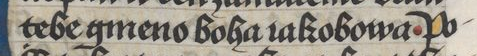tebe gmeno boha iakobowa.Po¬
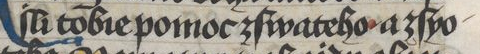ẛli tobie pomoz zſwateho.a zſyo¬
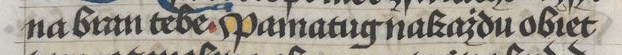na bran tebe.Pamatug nakażdu obiet
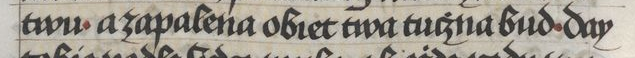twu.a zapalena obiet twa tucżna bud.day
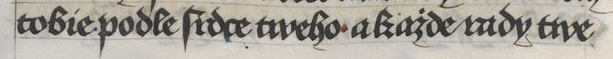tobie podle ſrdce tweho.a każde rady twe
